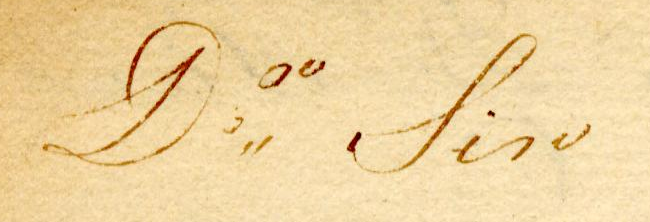D^r. Sir
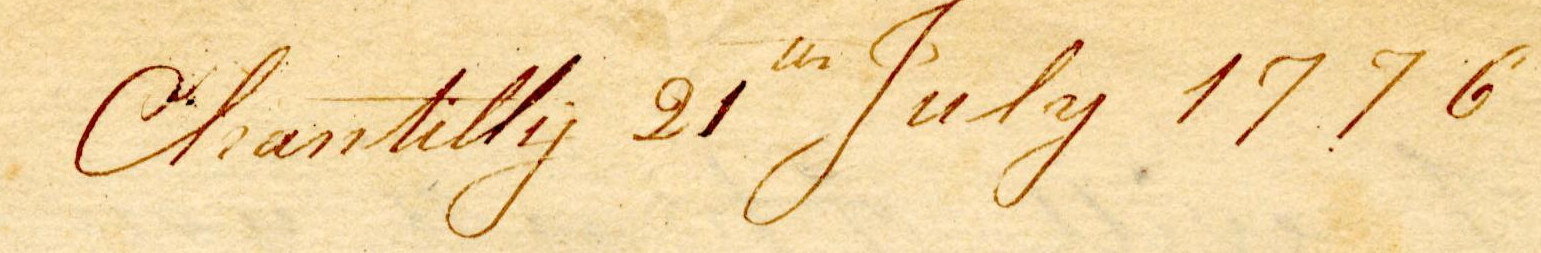Chantilly 21^th July 1776
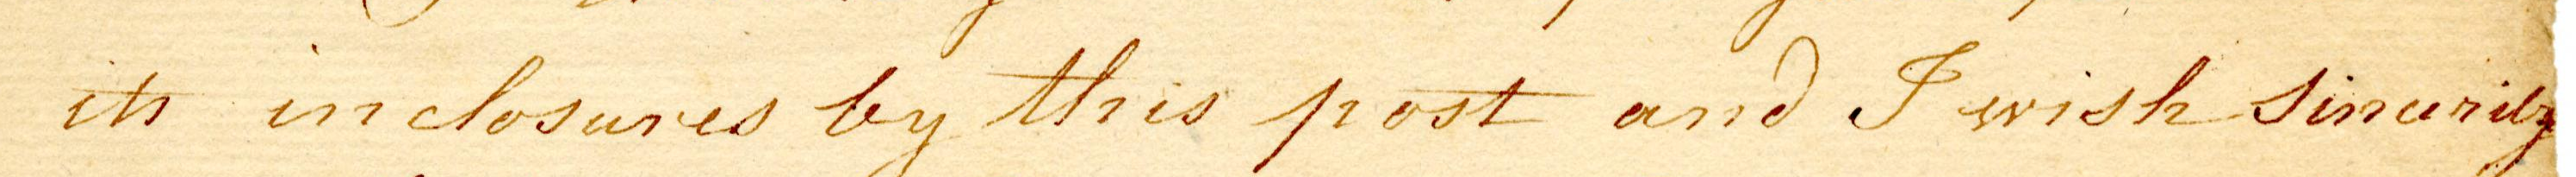its inclosures by this post and I wish sincerily
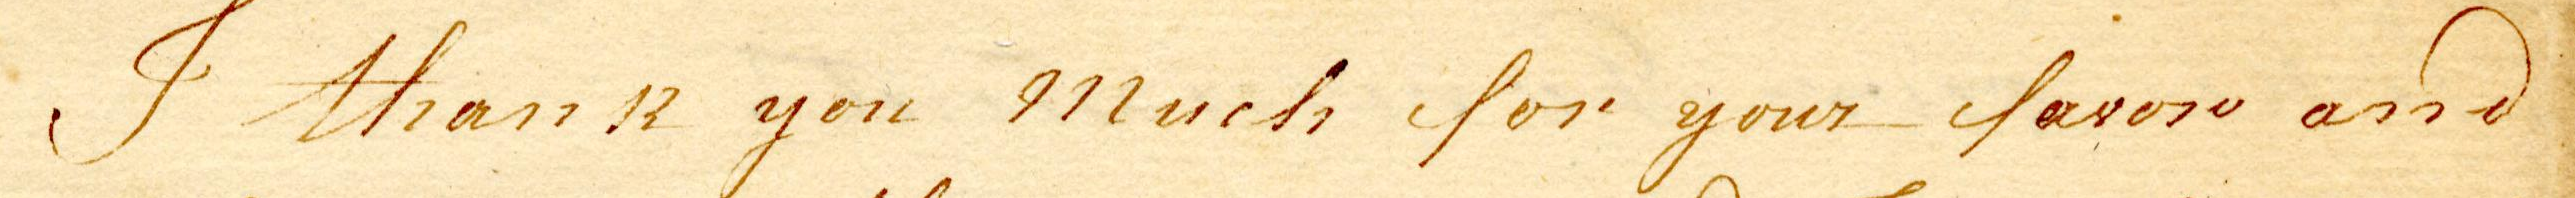I thank you Much for your favor and
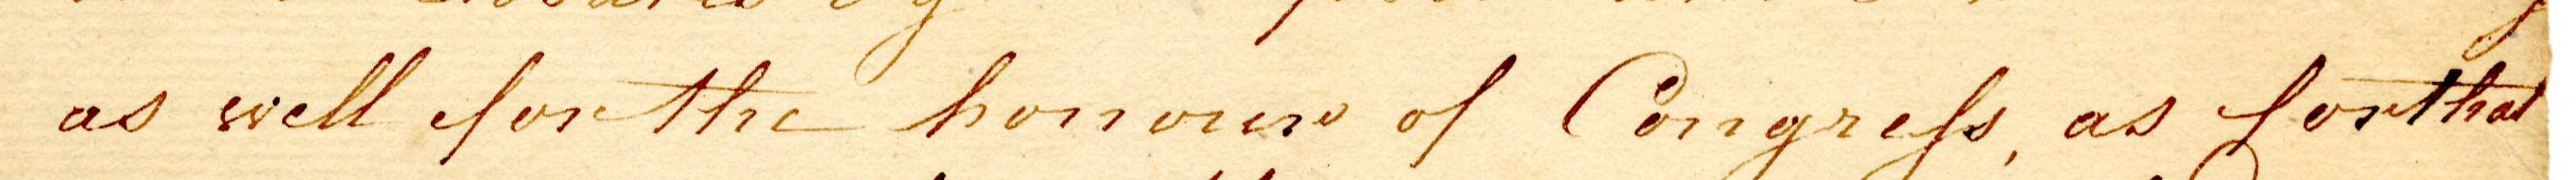as well for the honoure of Congress, as for that
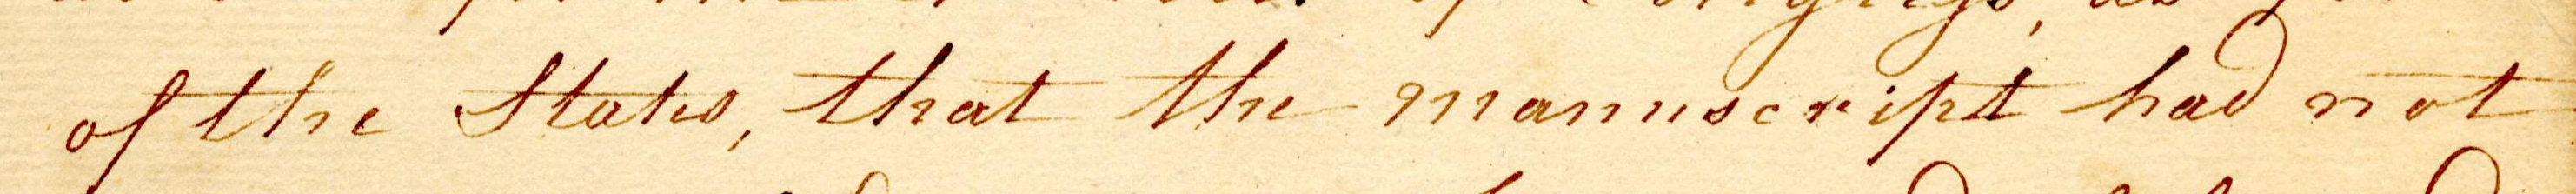of the states, that the manuscript had not
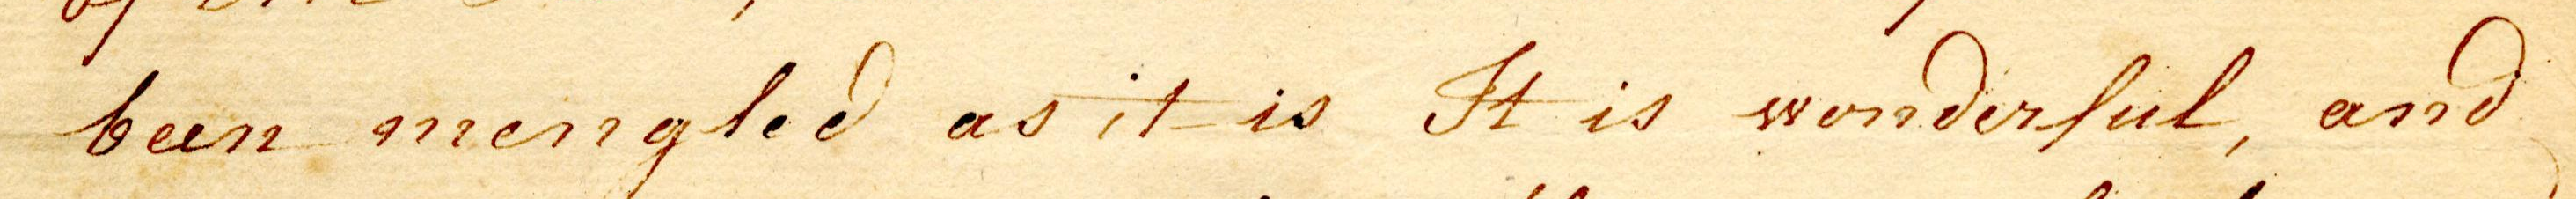been mengled as it is It is wonderful, and
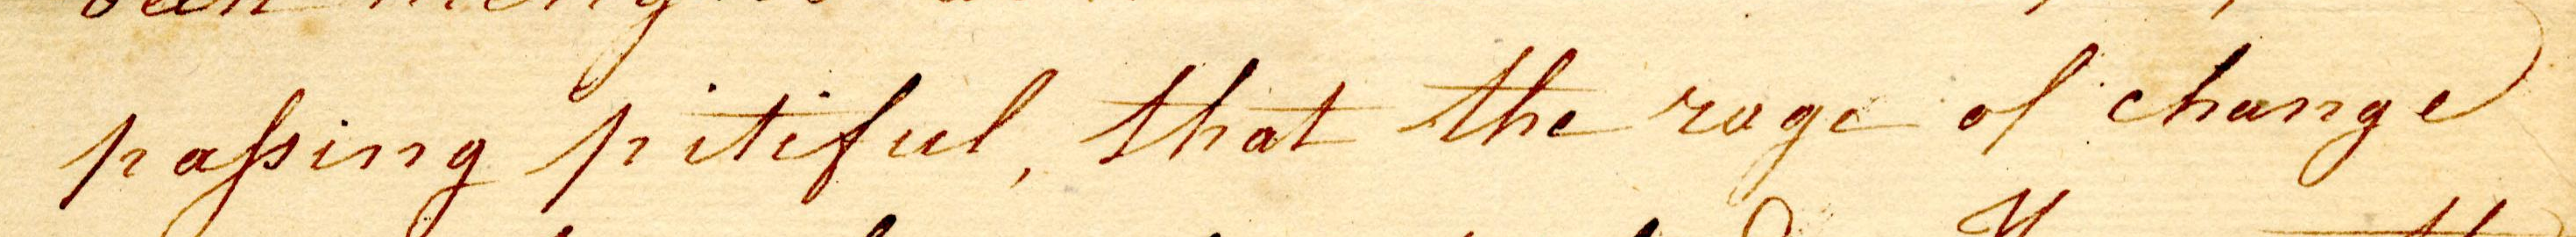passing pitiful, that the rage of change
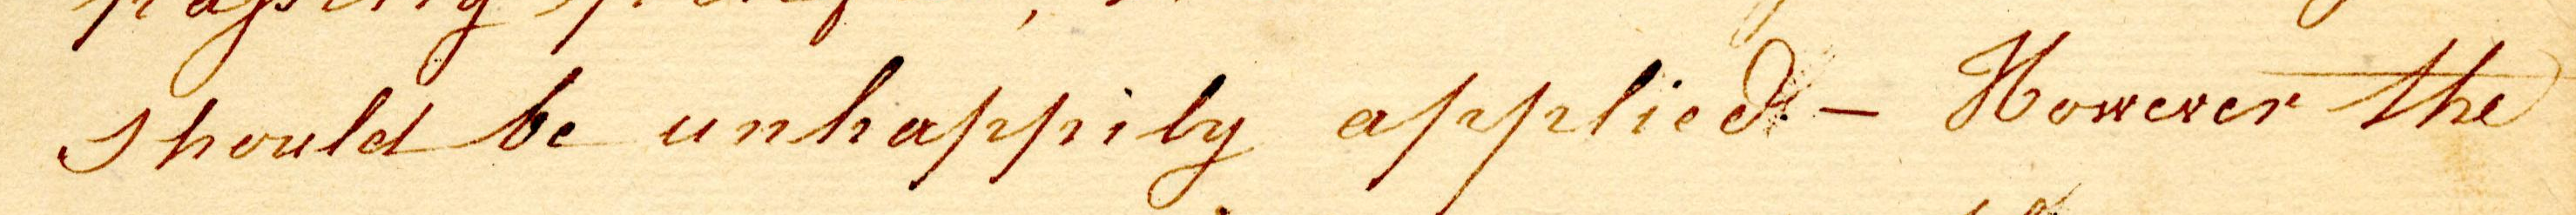should be unhappily applied- However the
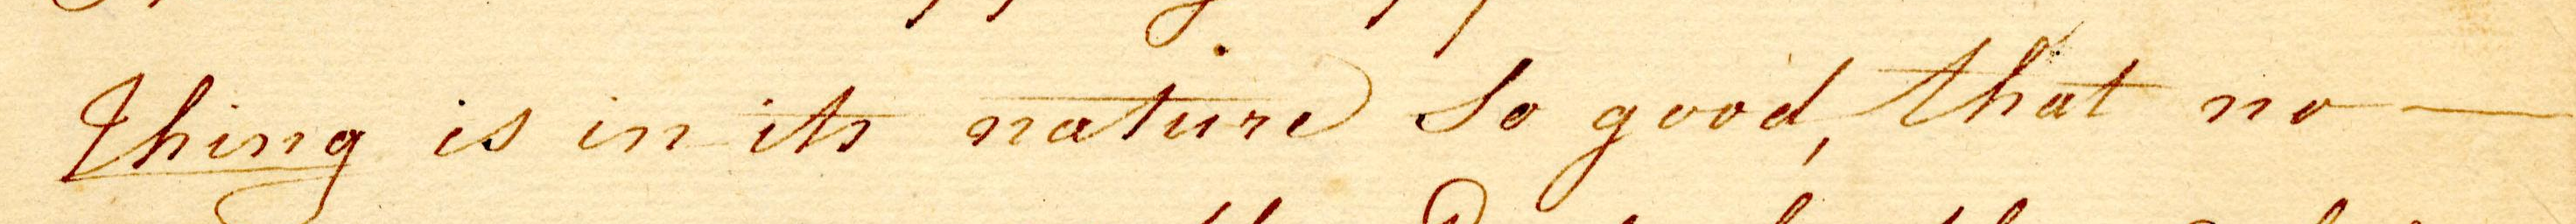thing is in its nature so good that no-
